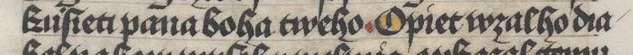kuẛieti pana boha tweho.Opiet wzal ho dia¬
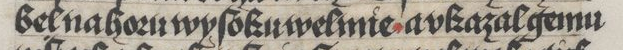bel na horu wyſoku welmie.a vkazal gemu
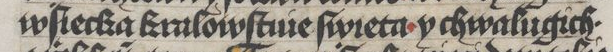wẛiecka kralowſtuie ſwieta.y chwalu jich.
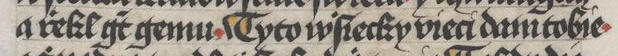a ṙekl ḡt gemu.Tyto wẛiecky vieci dam tobie.
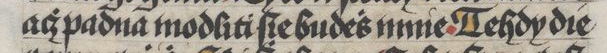acż padna modliti ſie budeṡ mie.Tehdy die
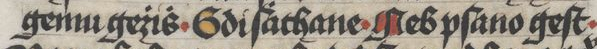gemu geżiṡ.Gdi ẛathane.Neb pſano geſt¬
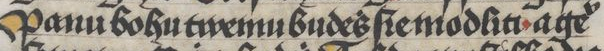Panu bohu twemu budeṡ ſie modliti a ḡev
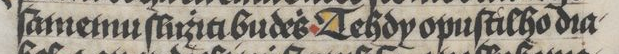ſamemu ſlużiti budeṡ.Tehdy opuſtil ho dia¬
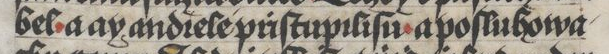bel.a ay andielé pṙiſtupili ſu.a poſluhowa¬
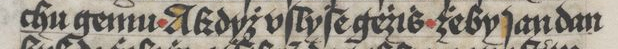chu gemu.A kdyż vſlyẛe geżiṡ.żeby Ian dan
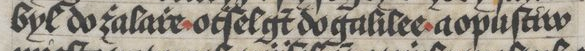byl do żalaṙe.otẛel ḡt do galilee.a opuſtiw
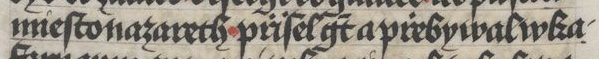mieſto nazereth.pṙiẛel ḡt a pṙebywal wka¬
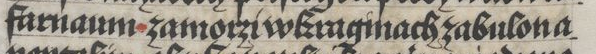farnaum.zamorzí wkraginach zabulona
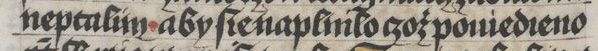neptalim.aby ſie naplnilo czoż pouiedieno
